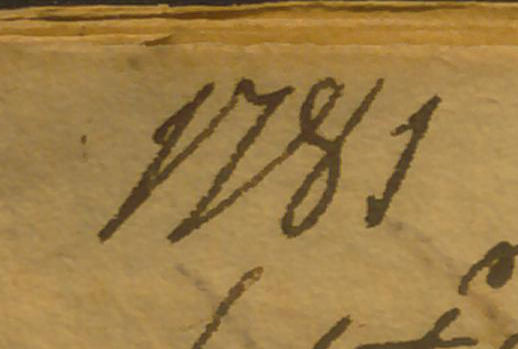1781
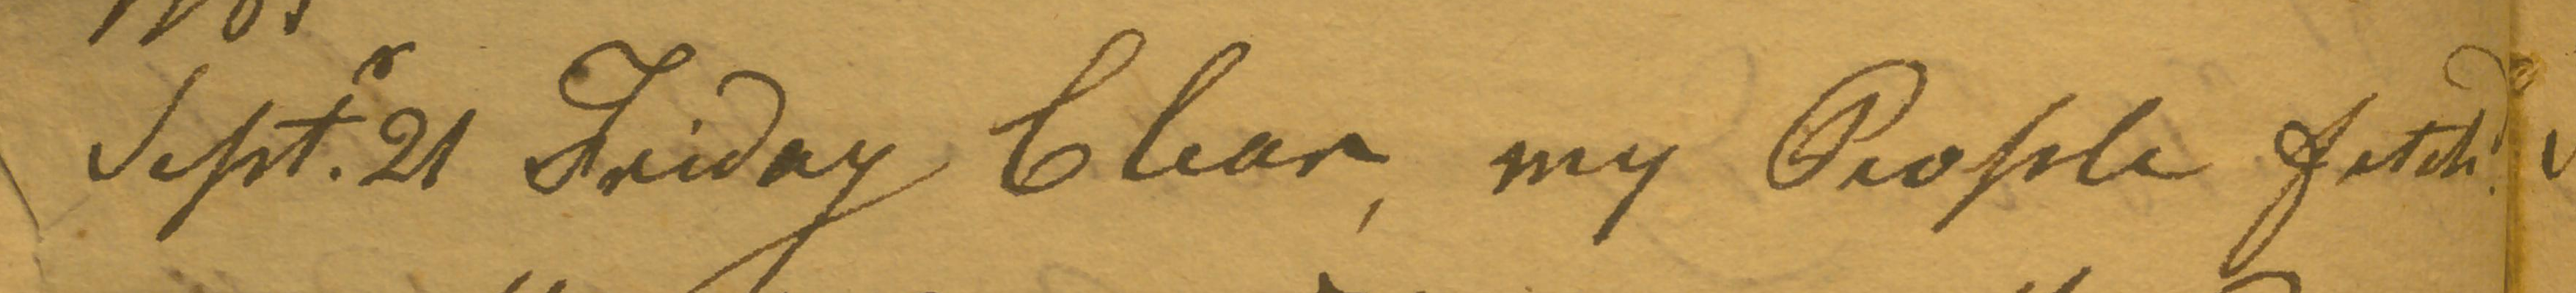Sept^r. 21 Friday Clear my People fetch^d.
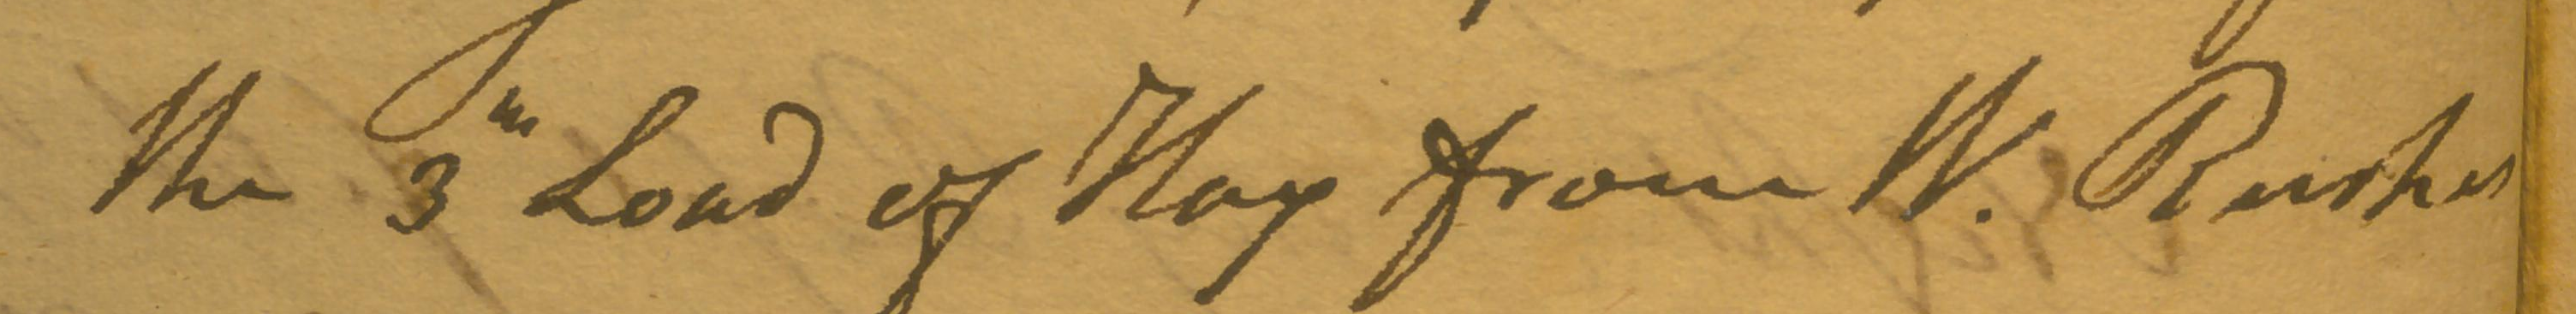The 3^th Load of Hay from W. Rushes
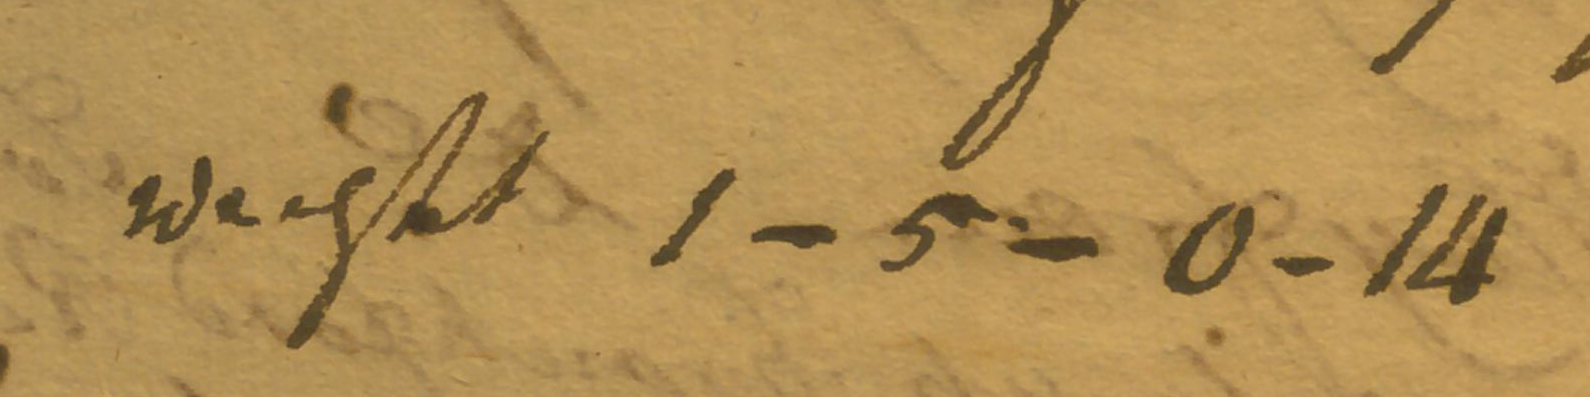weight 1-5-0-14
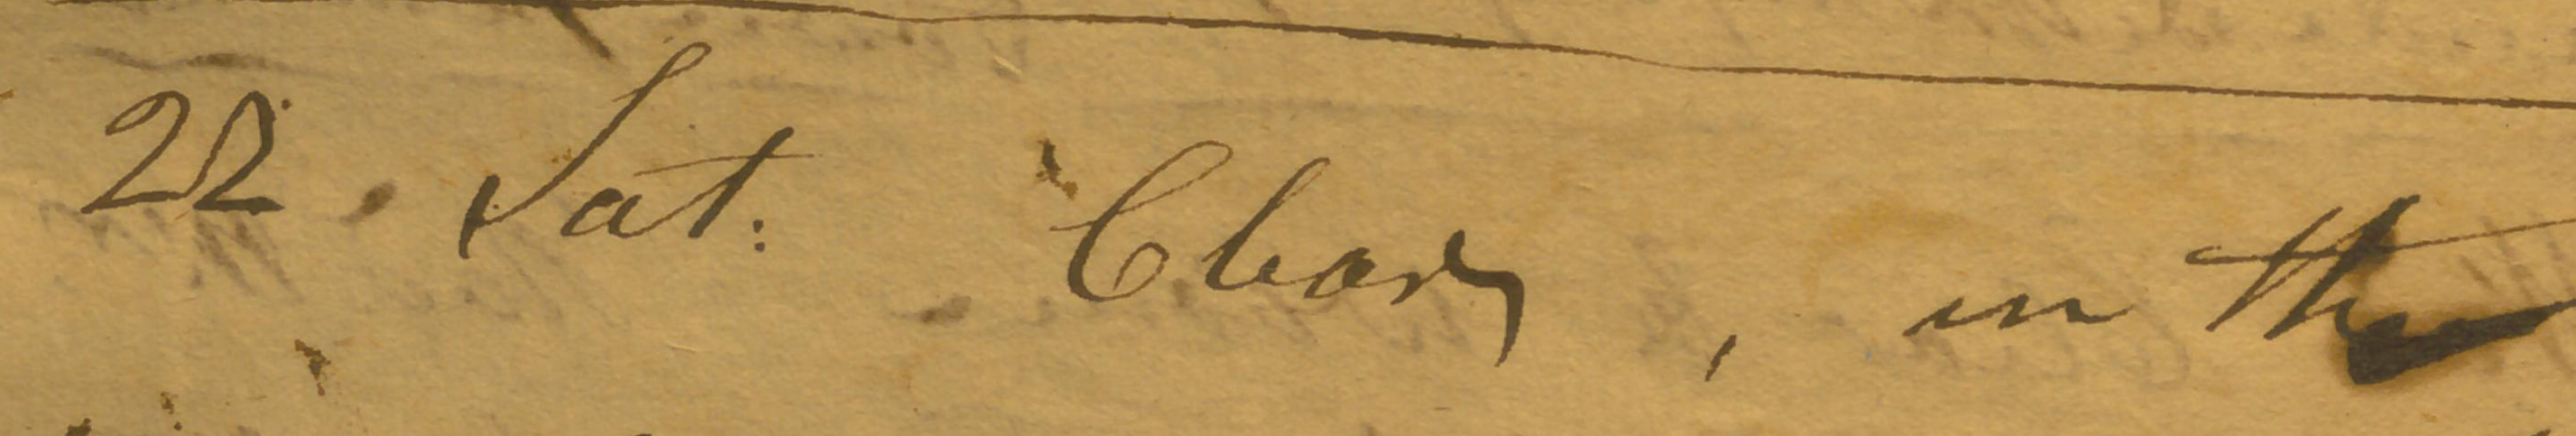22 Sat. Clear in the
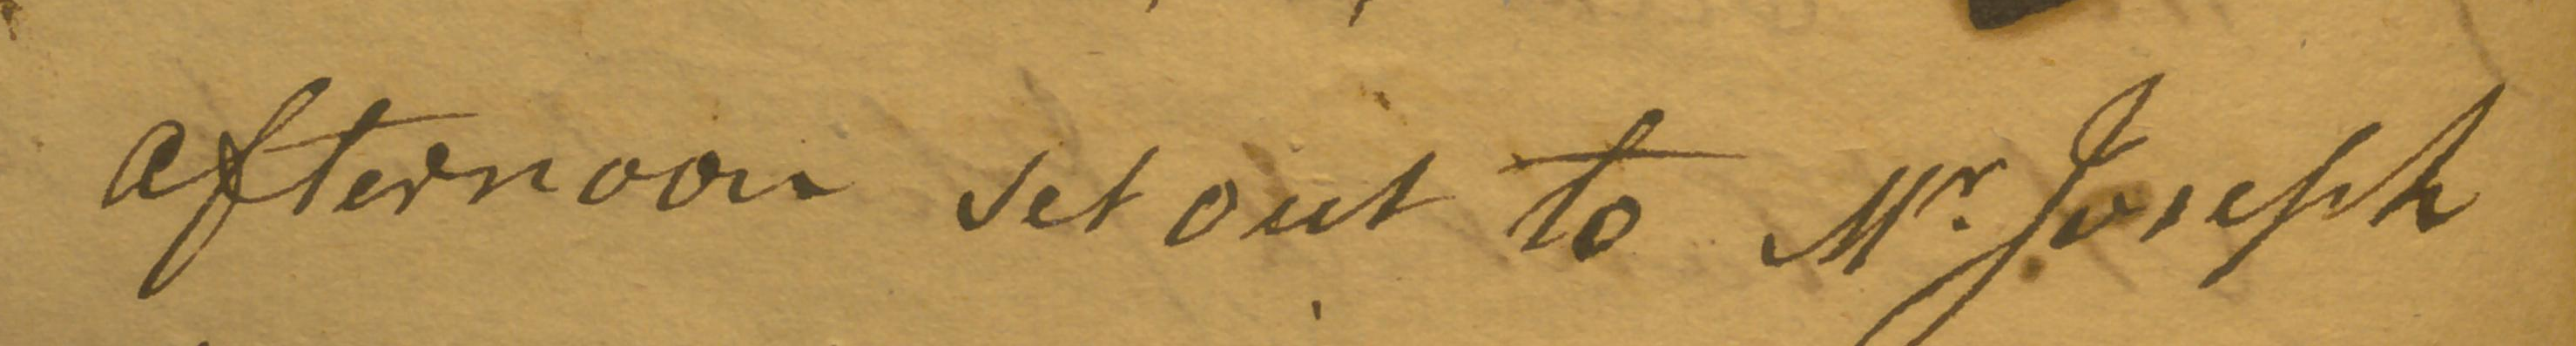afternoon set out to M^r. Joseph
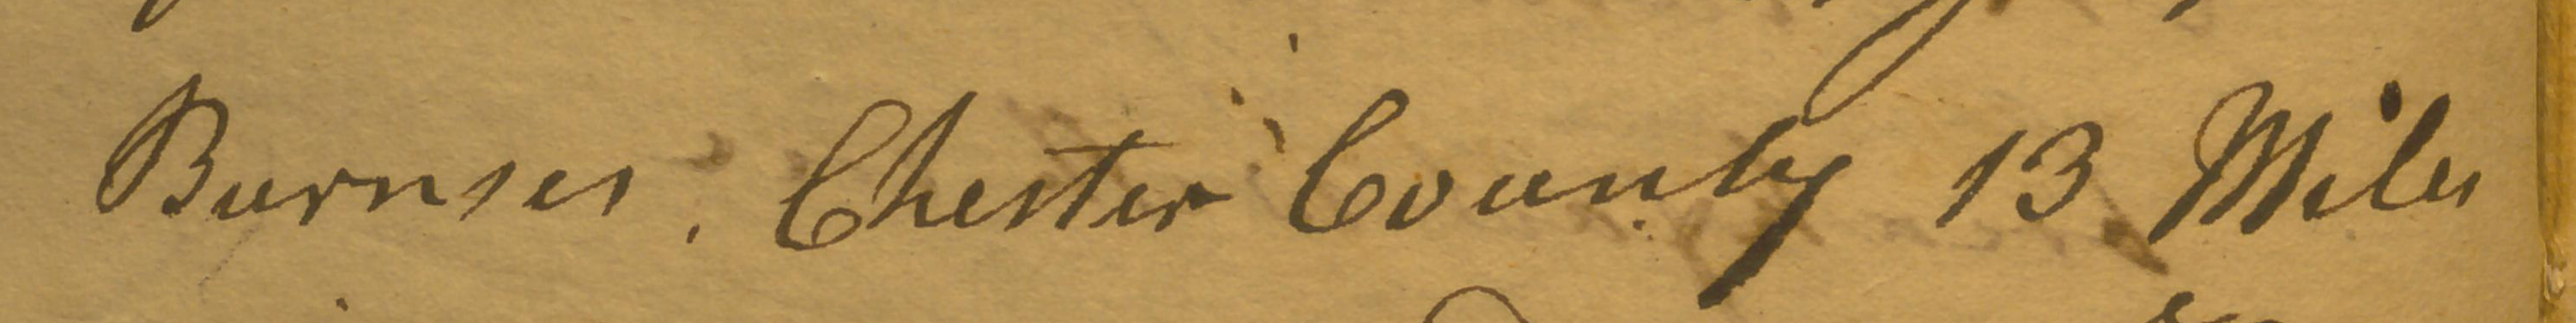Burnses. Chester County 13 Miles
